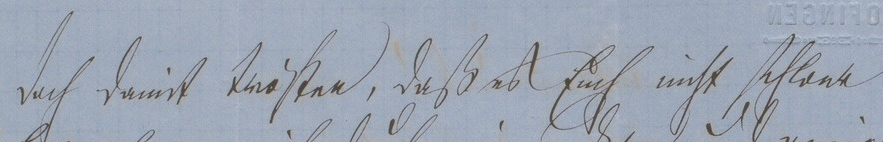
doch damit trösten, daß es Euch nicht schwer
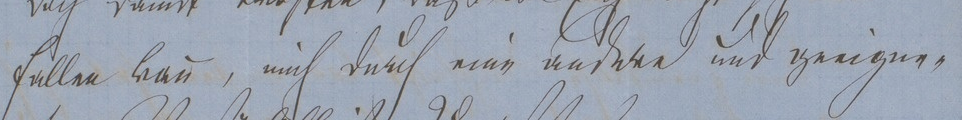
fallen kann, mich durch eine andere und geeigne-
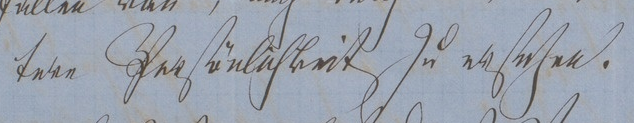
tere Persönlichkeit zu ersezen.
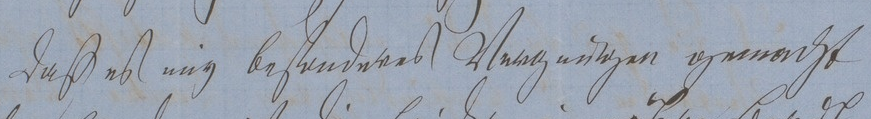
Daß es mir besonderes Vergnügen gemacht
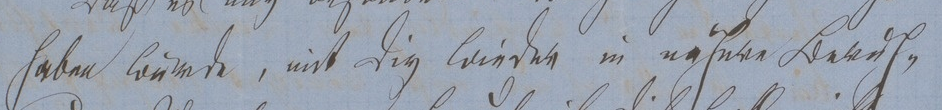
haben würde, mit Dir wieder in nähere Berüh-
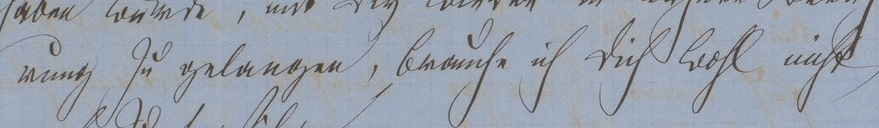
rung zu gelangen, brauche ich Dich wohl nicht
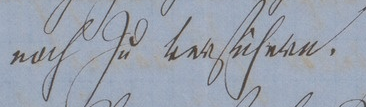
noch zu versichern.
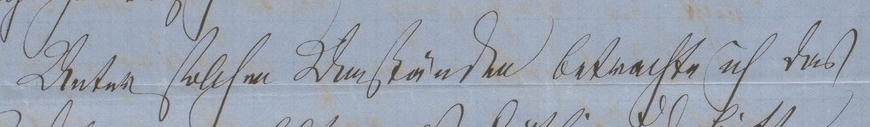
Unter solchen Umständen betrachte ich das
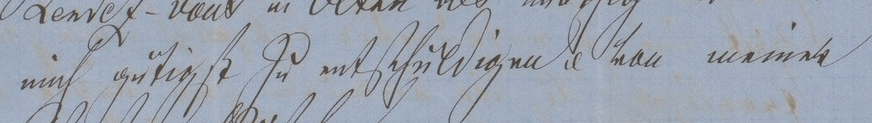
mich gütigst zu entschuldigen & von meiner
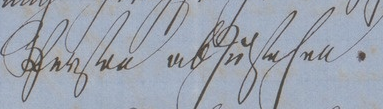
Person abzusehen.
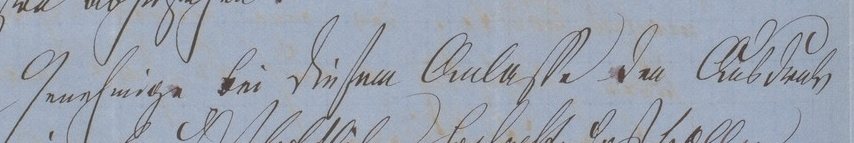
Genehmige bei diesem Anlasse den Ausdruck
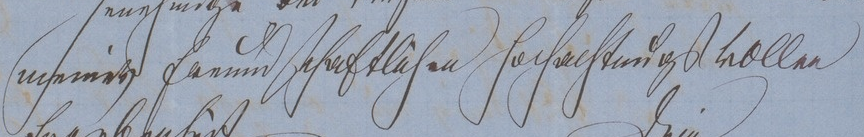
meiner freundschaftlichen hochachtungsvollen
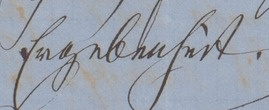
Ergebenheit.
